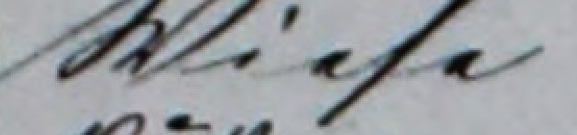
M. Bl. 36
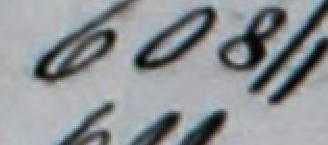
608/1
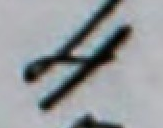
4
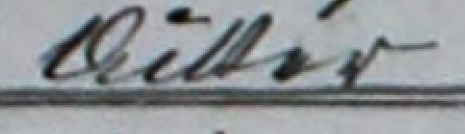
Outter
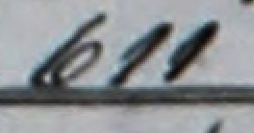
611
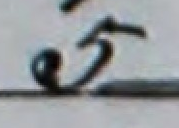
5
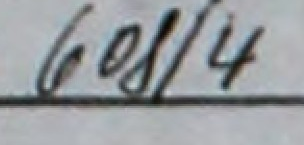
608/4
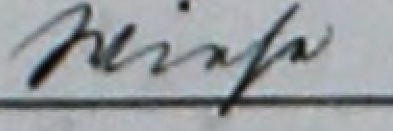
Wiese
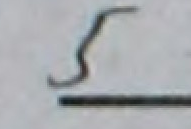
5
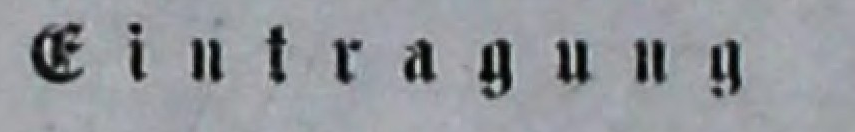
Eintragung
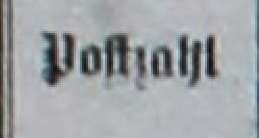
Postzahl
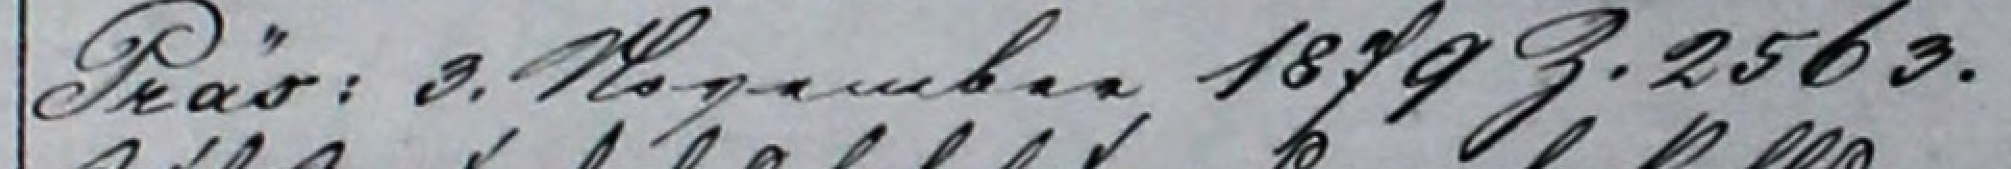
Präs: 3 November 1879 Z. 2563.
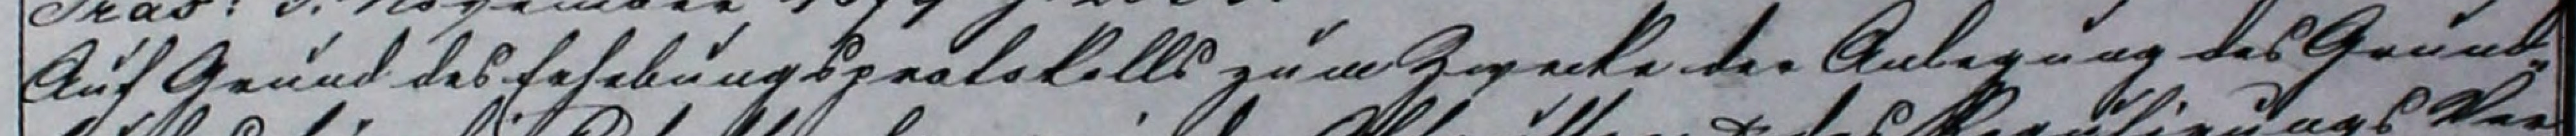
Auf Grund des Erhebungsprotskells zum Zwecke der Anlegung des Grund„
